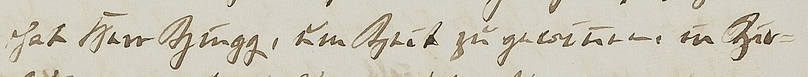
hat Herr Zingg, um Zeit zu gewinnen in Zir-
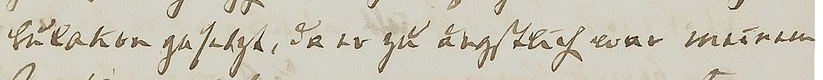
kulation gesetzt, da er zu ängstlich war meinem
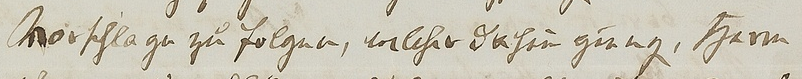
Vorschlage zu folgen, welcher dahin gieng, Herrn
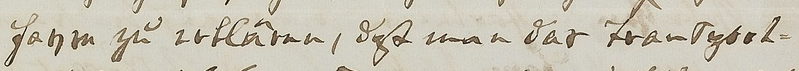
Favre zu erklären, daß man das Transport-
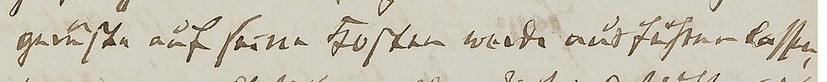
gerüste auf seine Kosten werde ausführen lassen,
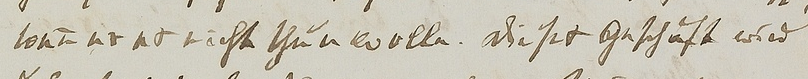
wenn er es nicht thun wolle. Dieses Geschäft wird
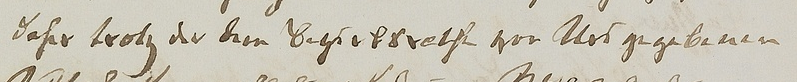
daher trotz der dem Bezirksrathe von Uri gegebenen
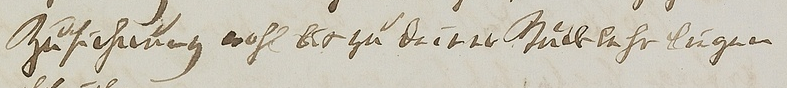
Zusicherung wohl bis zu Deiner Rückkehr liegen
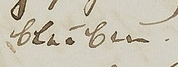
bleiben.
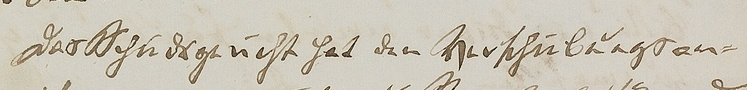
Das Schiedsgericht hat den Verschiebungsan-
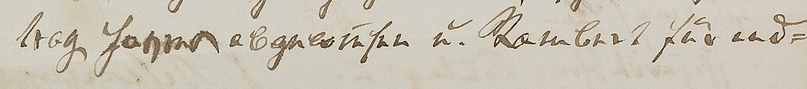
trag Favres abgewiesen u. Rambert für end-
